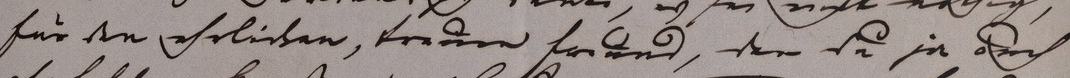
für den ehrlichen, treuen Freund, den Du ja auch
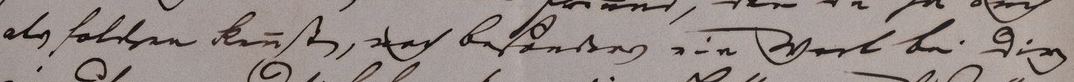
als solchen kennst, noch besonders ein Wort bei dir
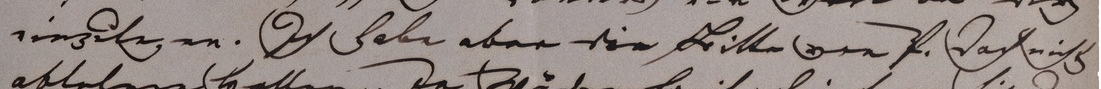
einzulegen. Ich habe aber die Bitte von P. doch nicht
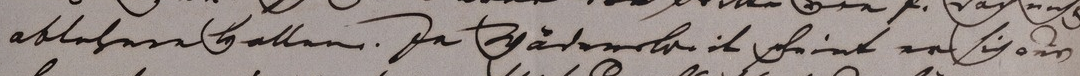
ablehnen wollen. In Wädensweil scheint er sich aus
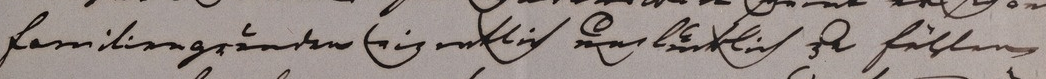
Familiengründen eigentlich unglücklich zu fühlen.
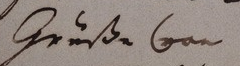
Grüße von
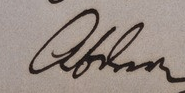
Escher
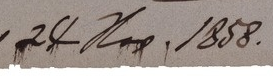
24 Nov. 1858.
